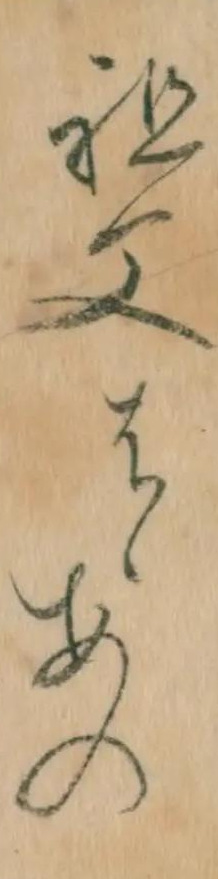祖父はゝあの
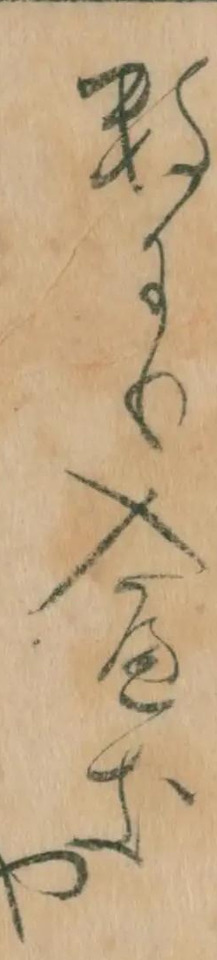数にも入へきや
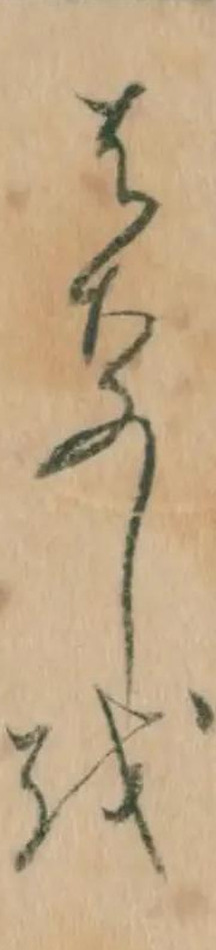はなしを
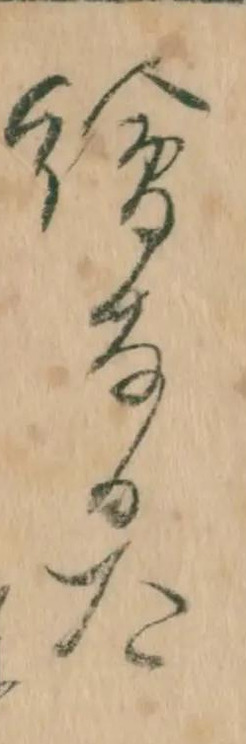繪なるた
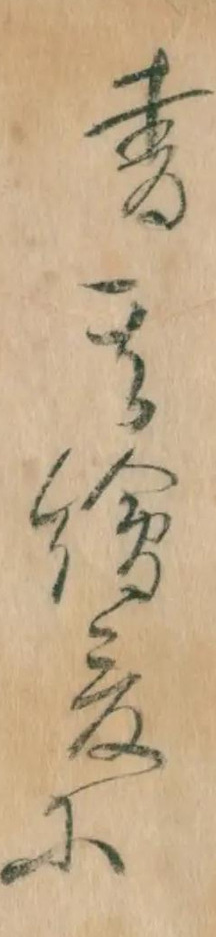書其繪爰に
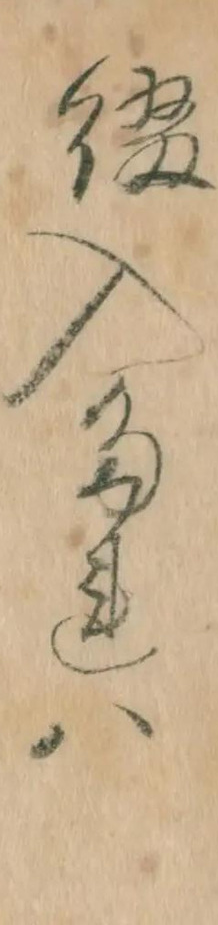綴入たれは
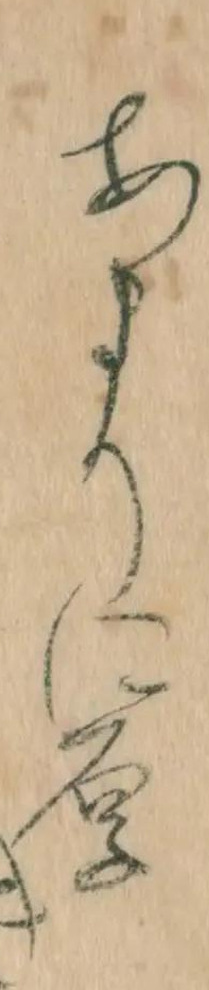あまりに厚き

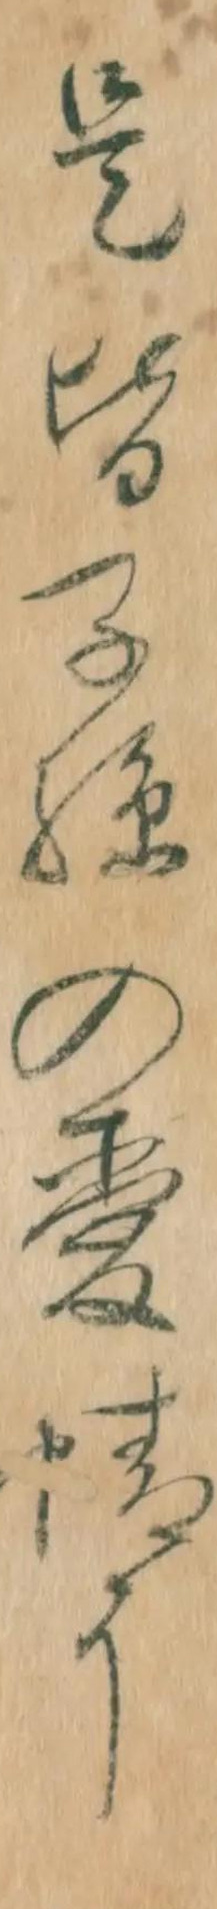是皆子孫の愛情に
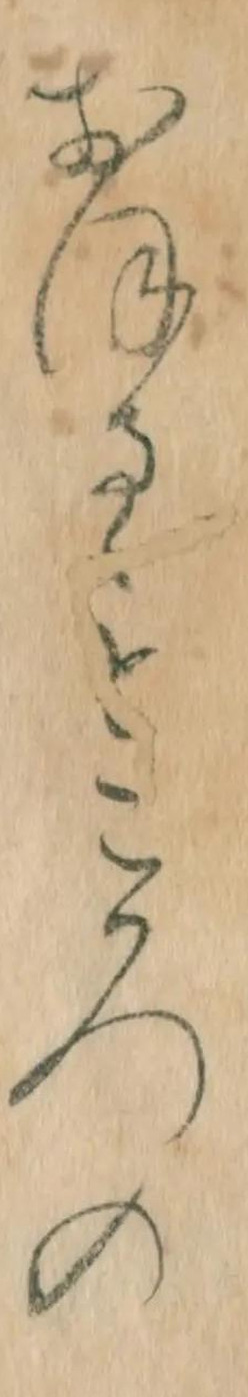おほるゝところの
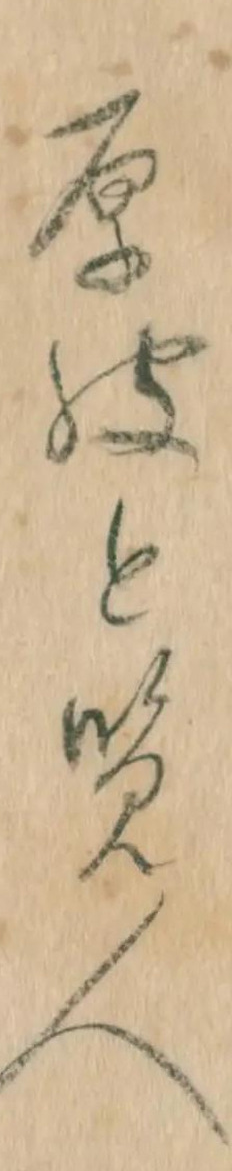原皮と覧人
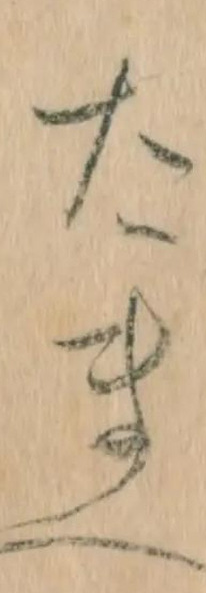たまへ
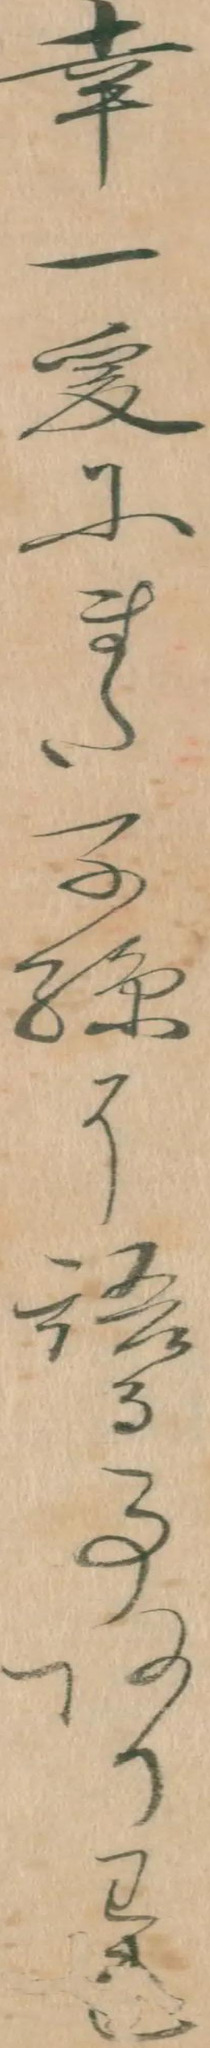幸一爰にまた子孫に語る事ありわ
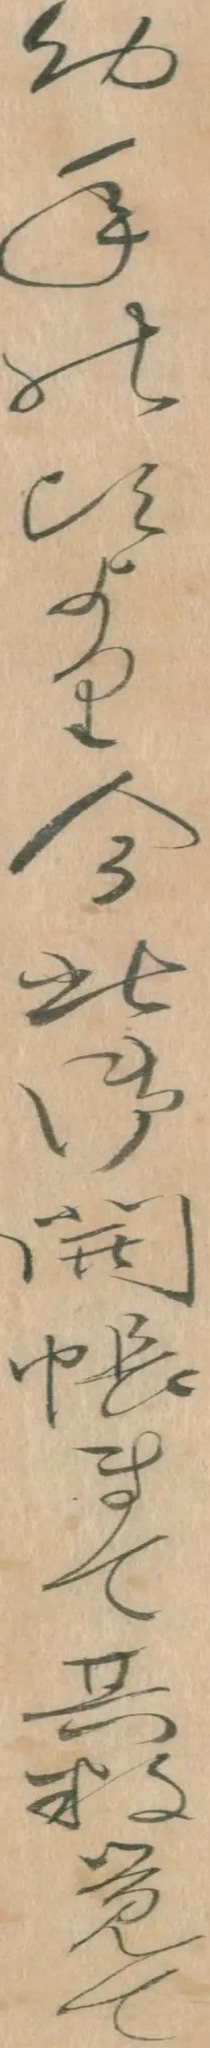幼年のひより今此御開帳まて其数覚て
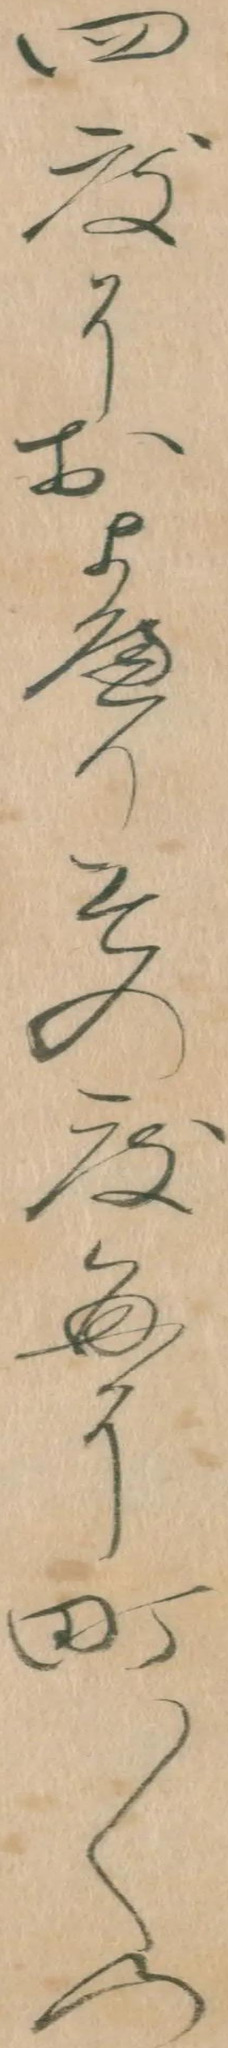四度におよへりその度毎に町〳〵の
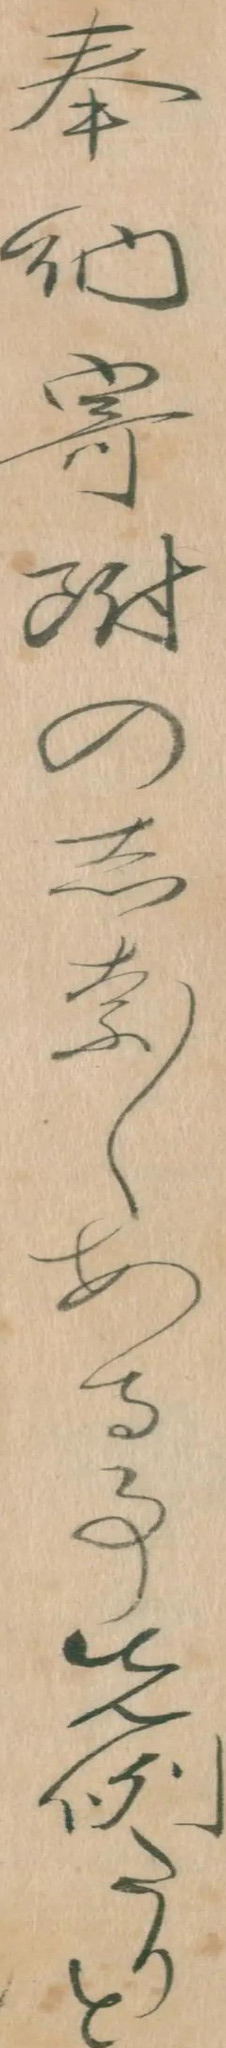奉納寄附のしな〳〵ある事先例たりと
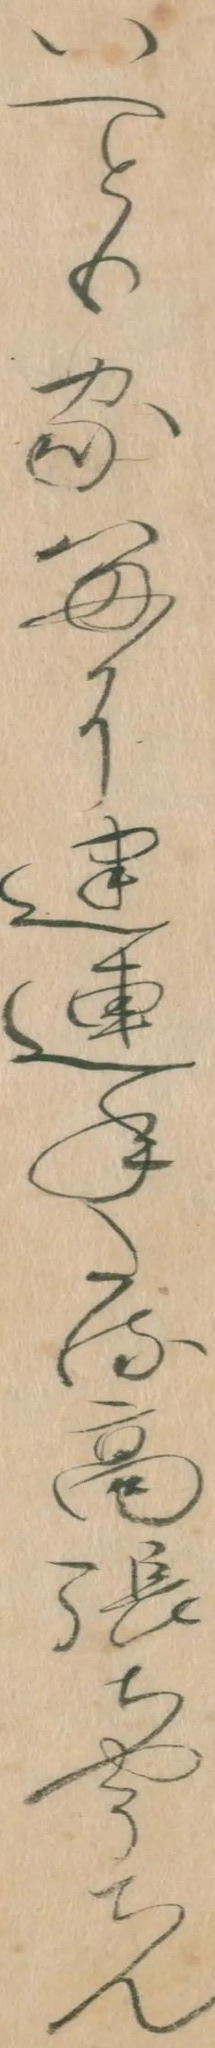いへとも家毎に建連ねたる高張ちやうちん
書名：俗語之種. [2]
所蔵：国立国会図書館 National Diet Library, JAPAN
